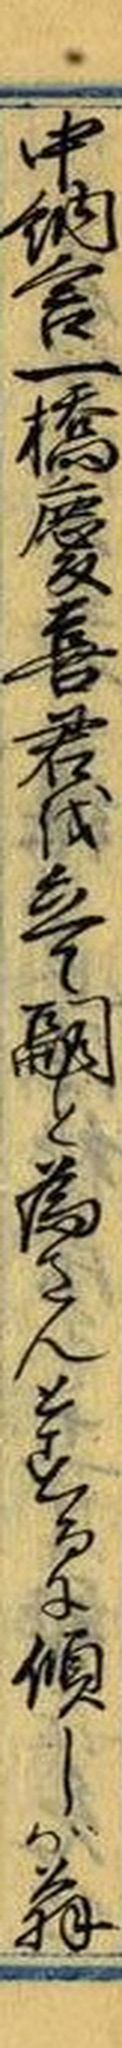中納言一橋慶喜君を立て嗣と為さんとするに傾しが翁
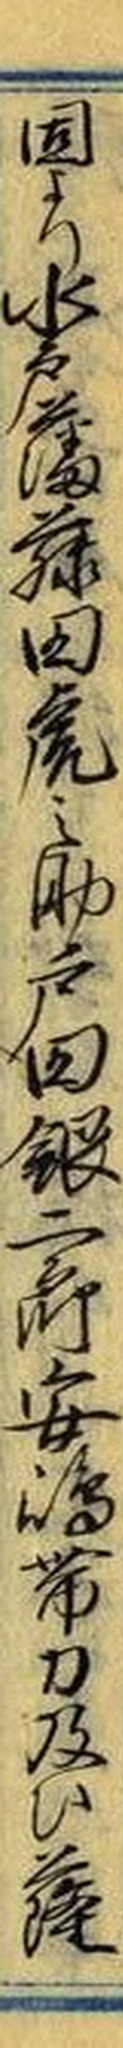固より水戸藩藤田虎之助戸田銀二郎安嶋帯刀及び薩
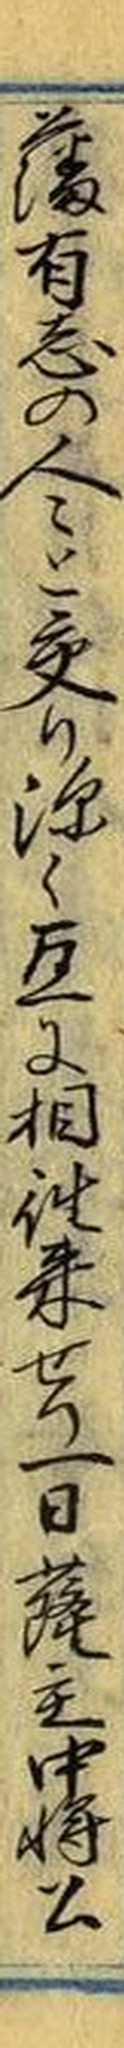藩有志の人々と交り深く互に相往来せり一日薩主中将公
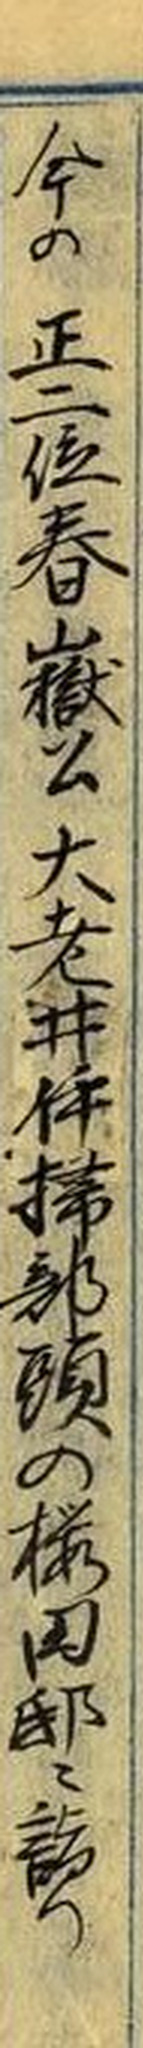今の正二位春嶽公大老井伊掃部頭の桜田邸ニ詣り
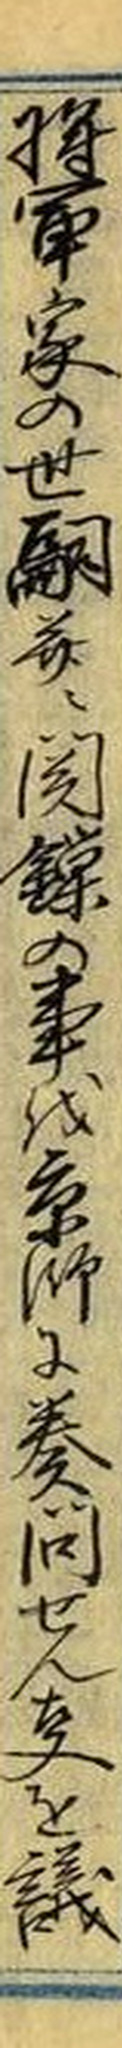将軍家の世嗣并ニ関鏁の事を京師に奏問せん事を議
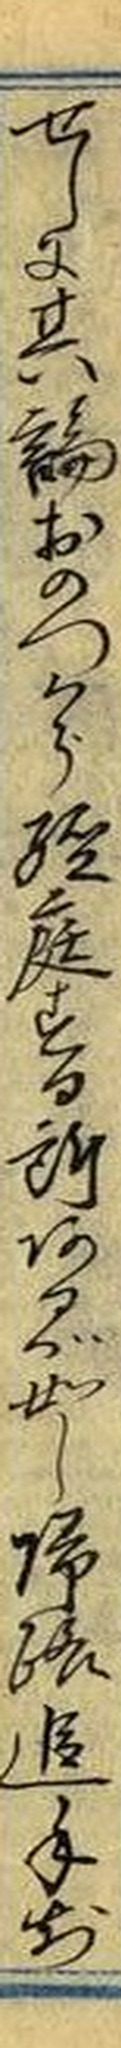せしに其論おのつから経庭する所なるが如し帰路追手前
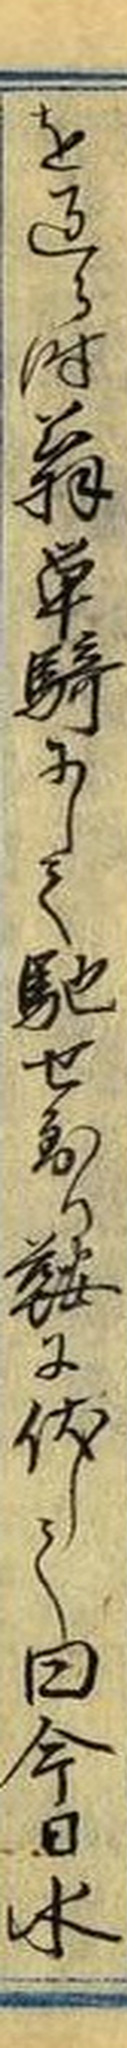を過る時翁単騎にして馳せ寄り鞍に伏して曰今日水
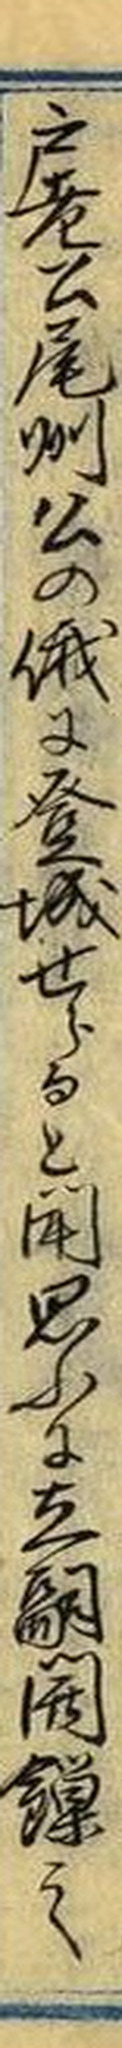戸老公尾州公の俄に東條登城せらると聞思ふに立嗣開鏁之
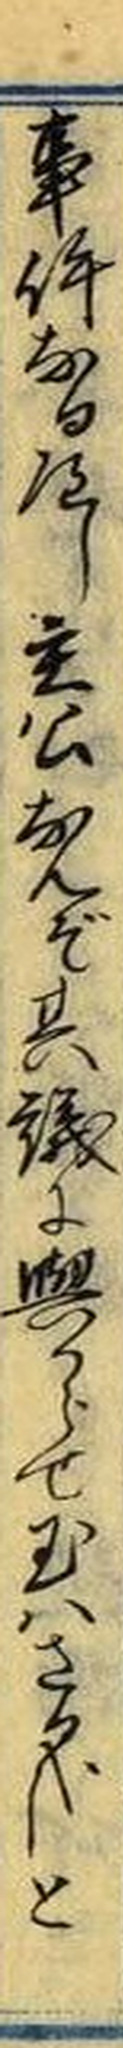事件なるへし主公なんぞ其議に與らせ玉ハさる哉と

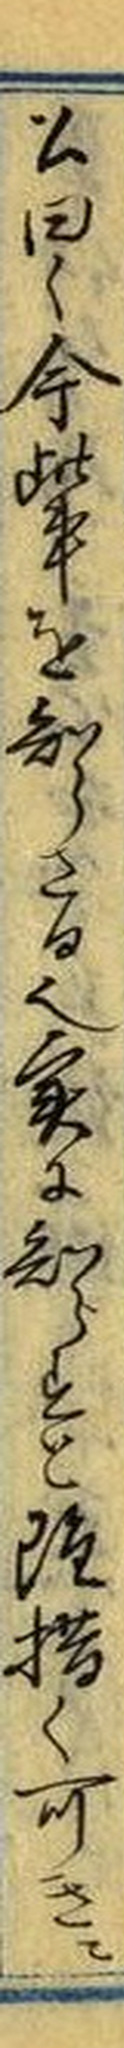公曰く今此事を知らさる也実に知らすと雖措く可きニ
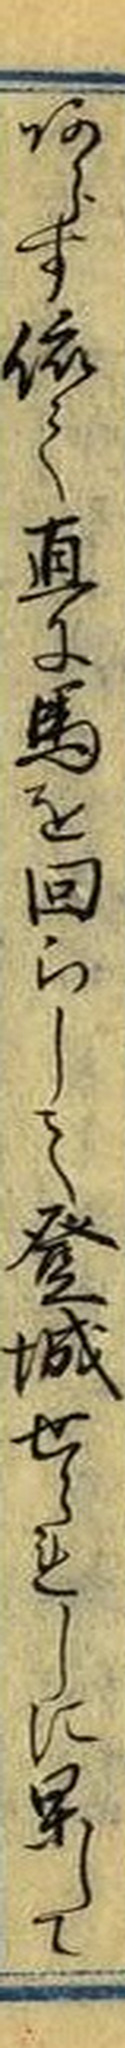あらす依之直に馬を回らして登城せられしに果して
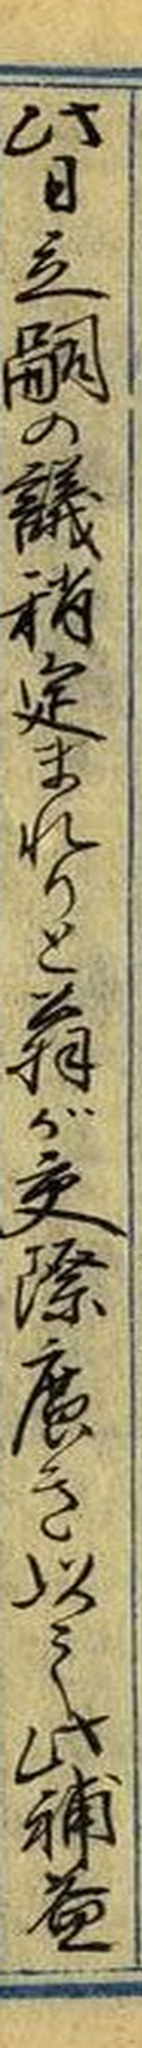此日立嗣の議稍定まれりと翁が交際広き以て此補益
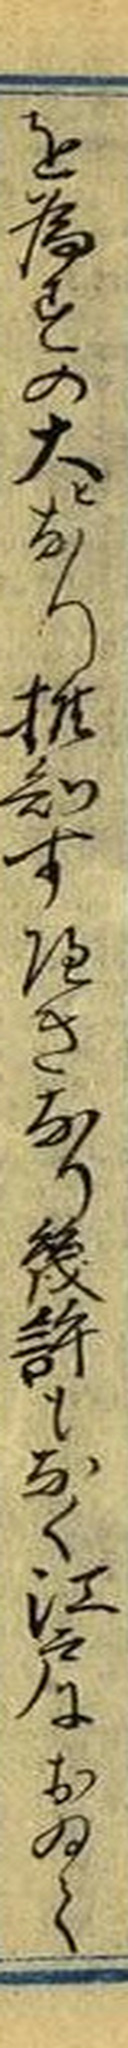を為すの大となり推知すへきなり幾許もなく江戸におゐて
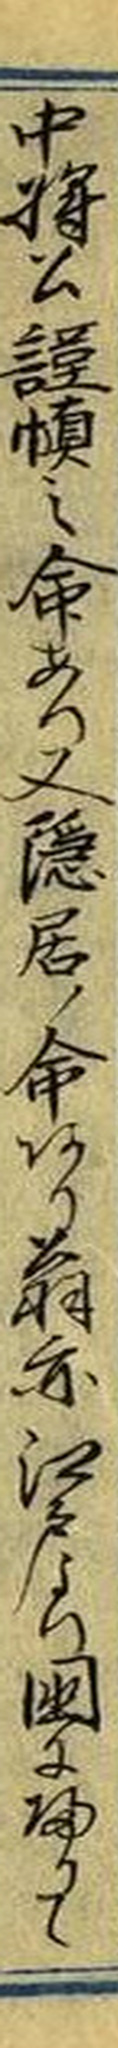中将公謹慎之命あり又隠居ノ命あり翁亦江戸より国に帰りて
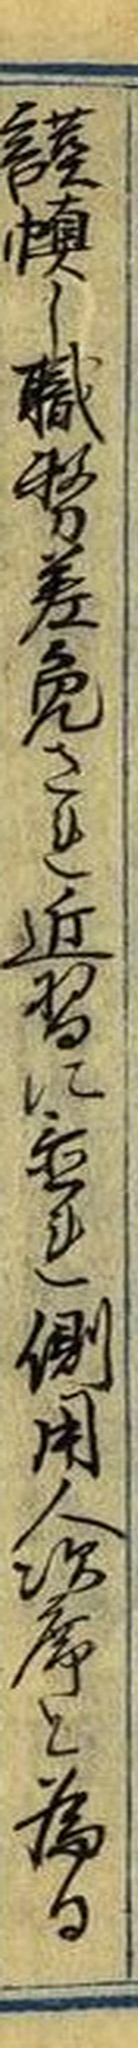謹慎之職務差免され近習に置れ側用人次席と為る
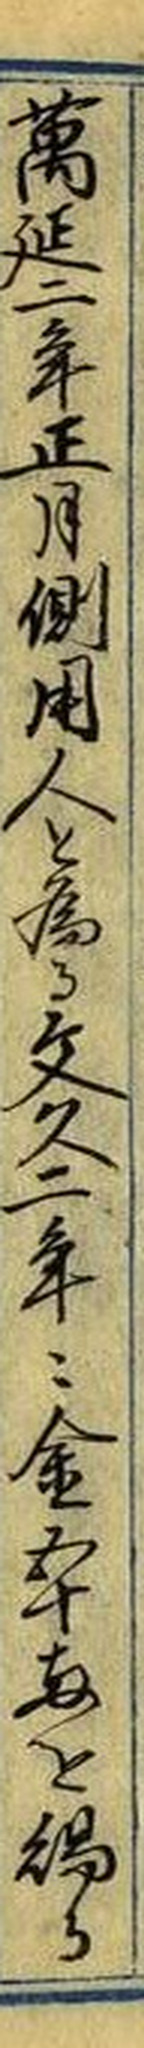万延二年正月側用人と為る文久二年ニ金五十両を賜る
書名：温古集 三巻
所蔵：福井県文書館 Fukui Prefectural Archives
